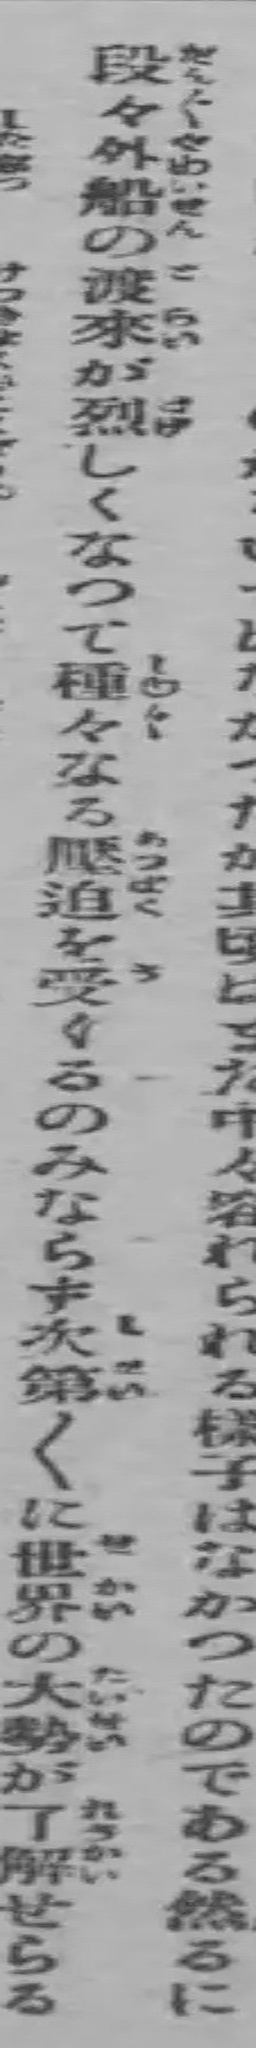段々外船の渡来が烈しくなつて種々なる圧迫を受くるのみならず次第〳〵に世界の大勢が了解せらる
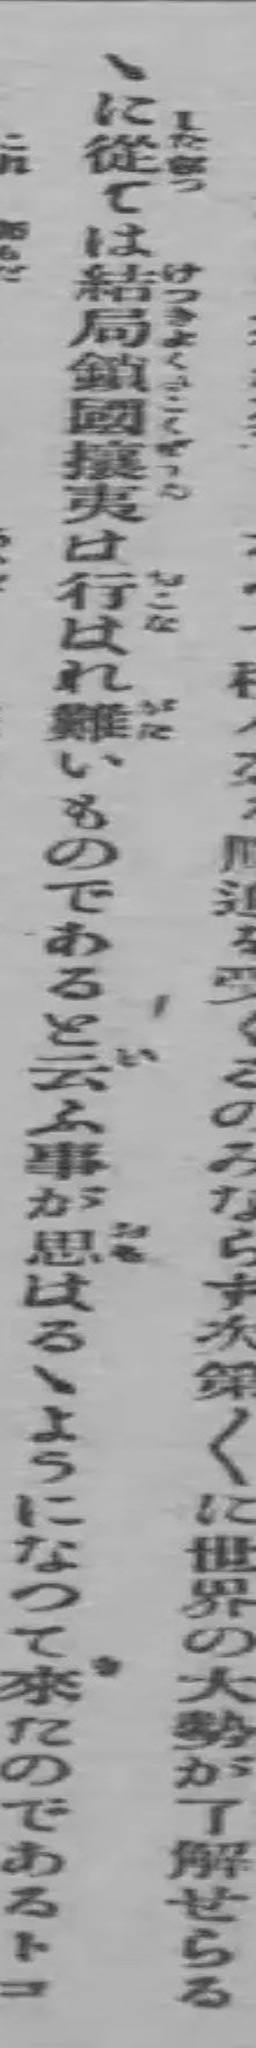ゝに従ては結局鎖国攘夷は行はれ難いものであると云ふ事が思はるゝようになつて来たのであるトコ
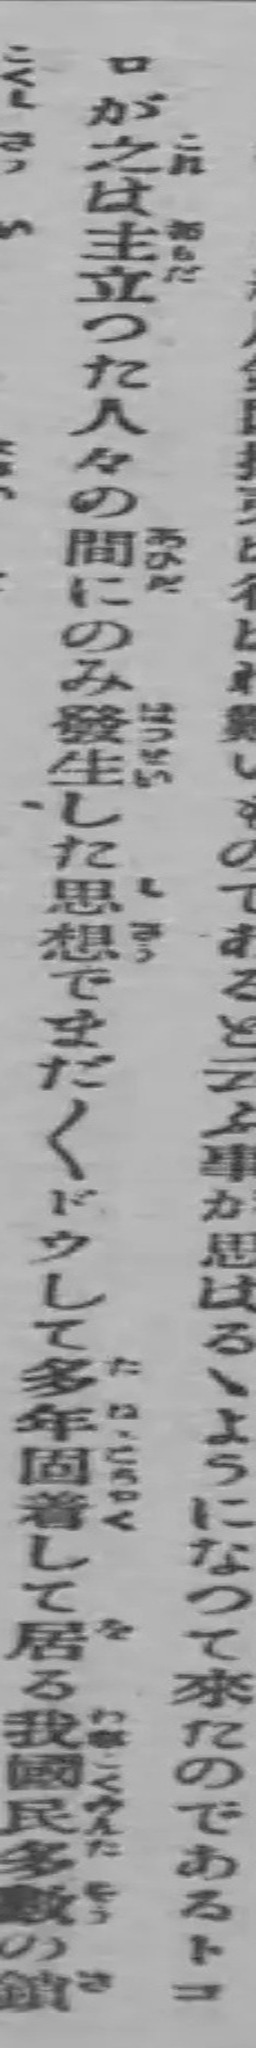ロが之は主立つた人々の間にのみ発生した思想でまだ〳〵ドウして多年固着して居る我国民多数の鎖
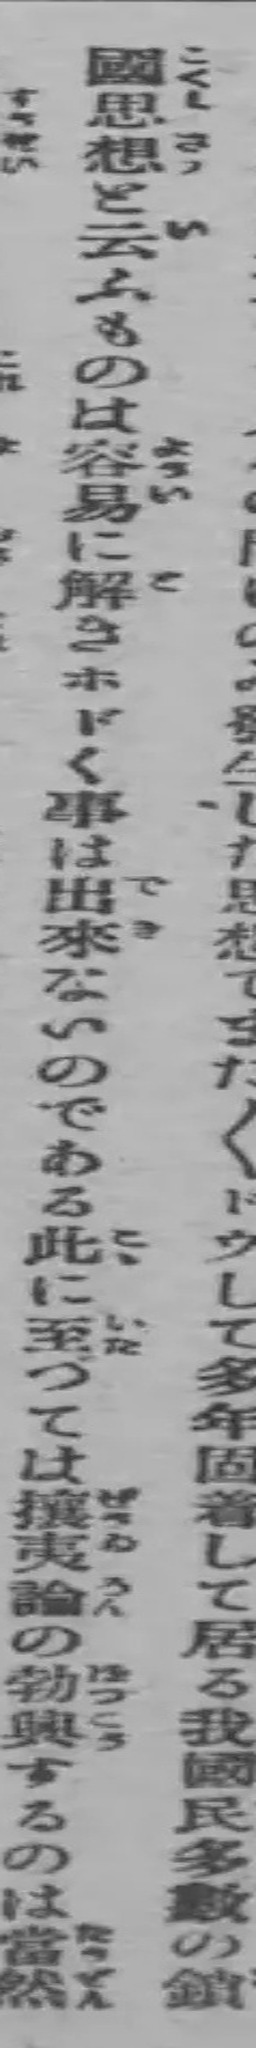国思想と云ふものは容易に解きホドく事は出来ないのである此に至つては攘夷論の勃興するのは当然
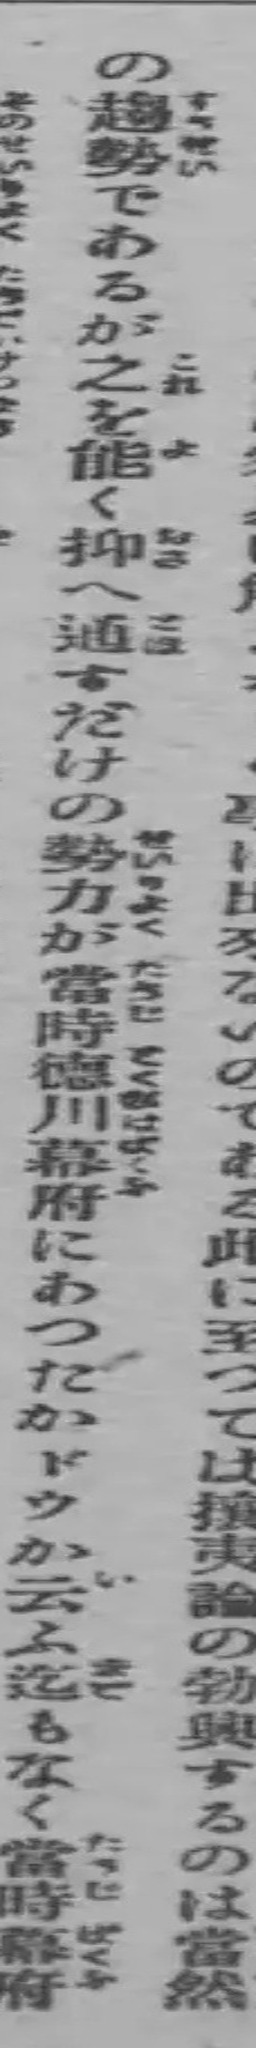の趨勢であるが之を能く抑へ通すだけの勢力が当時徳川幕府にあつたかドウか云ふ迄もなく当時幕府
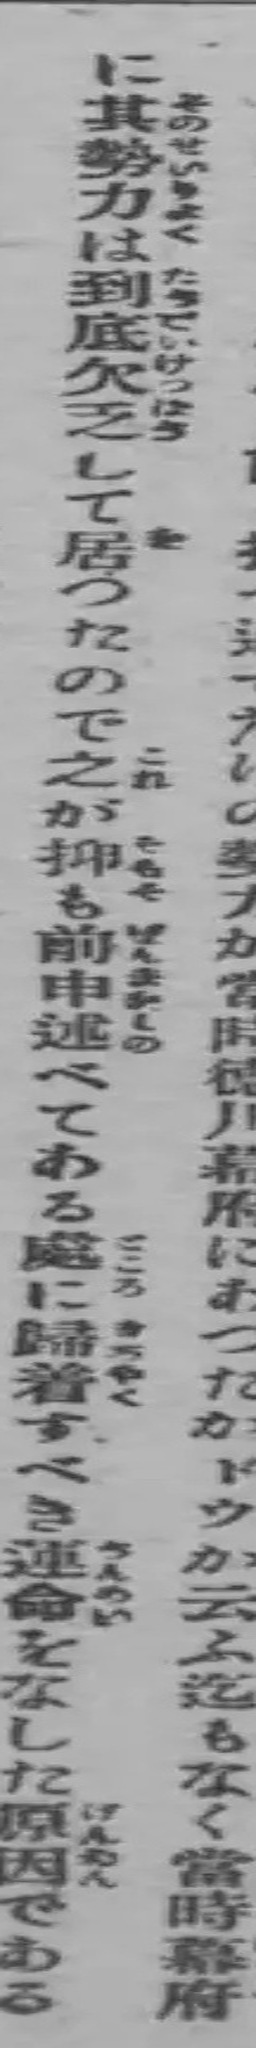に其勢力は到底欠乏して居つたので之が抑も前申述べてある処に帰着すべき運命をなした原因である
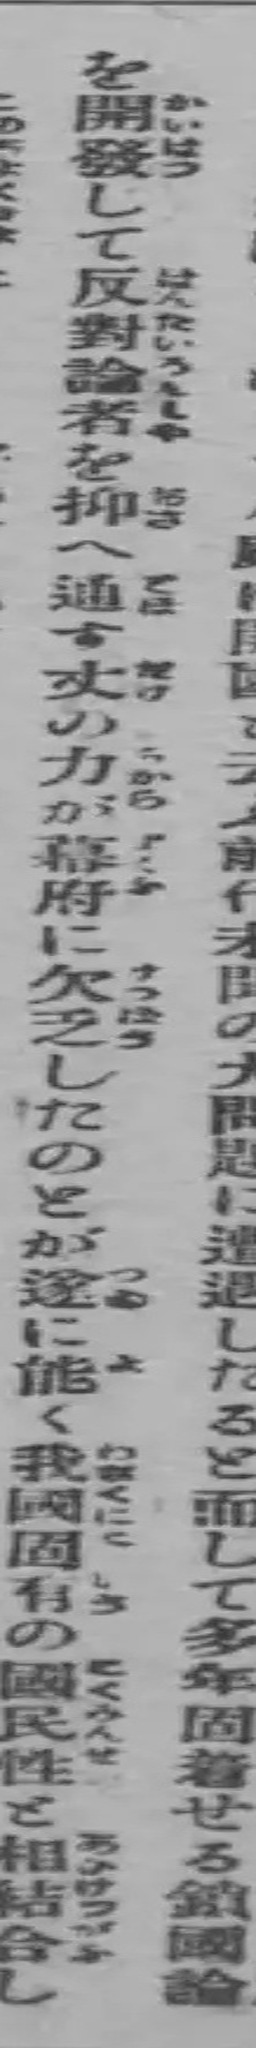を開発して反対論者を抑へ通す丈の力が幕府に欠乏したのとが遂に能く我国固有の国民性と相結合し
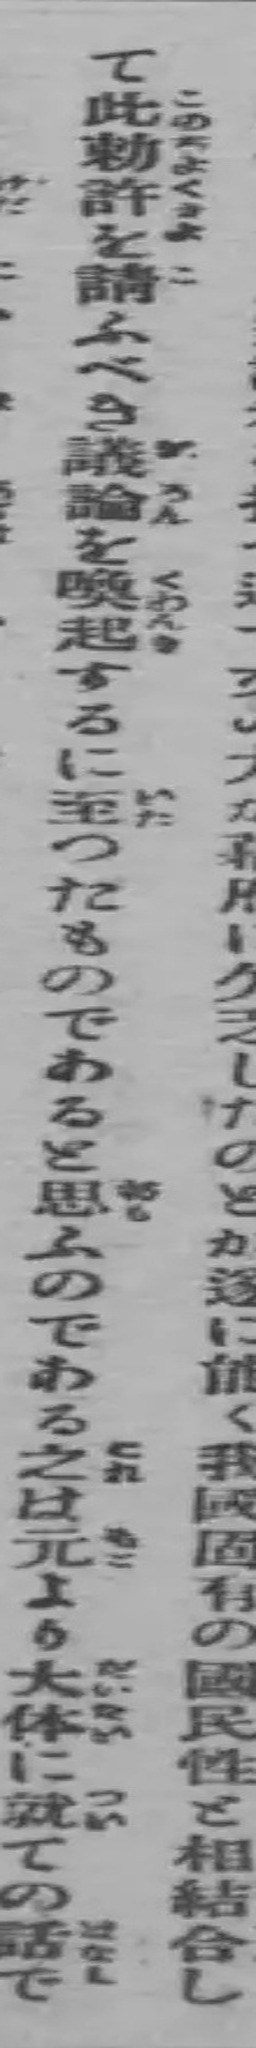て此勅許を請ふべき議論を喚起するに至つたものであると思ふのである之は元より大体に就ての話で
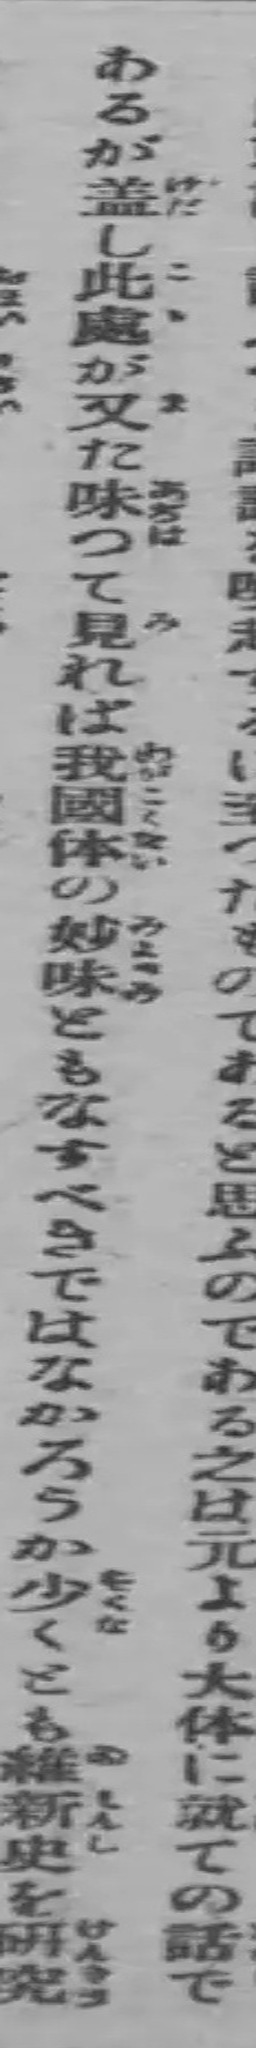あるが蓋し此処が又は味つて見れば我国体の妙味ともなすべきではなかろうか少くとも維新史を研究
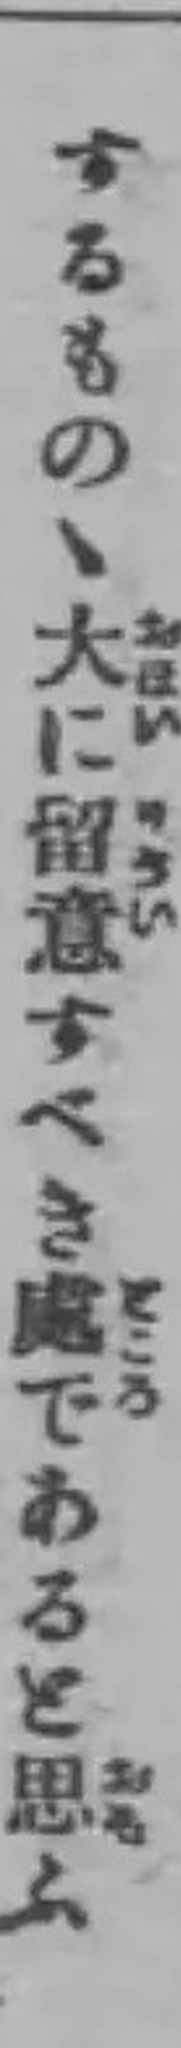するものゝ大に留意すべき処であると思ふ
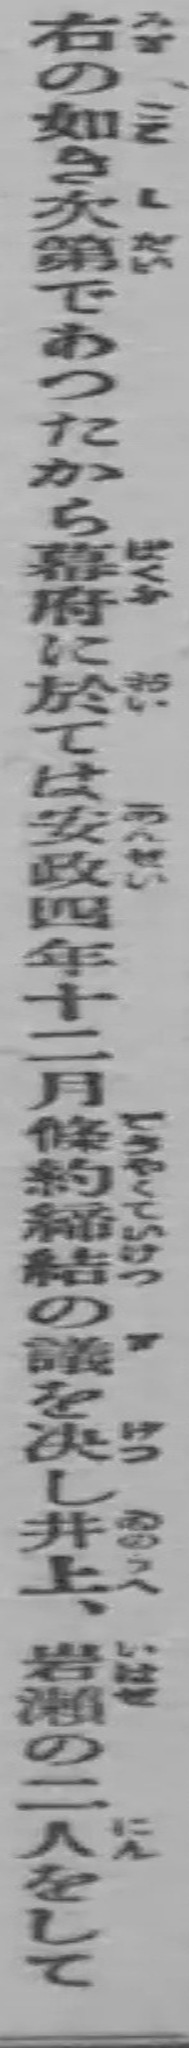右の如き次第であつたから幕府に於ては安政四年十二月条約締結の議を決し井上、岩瀬の二人をして
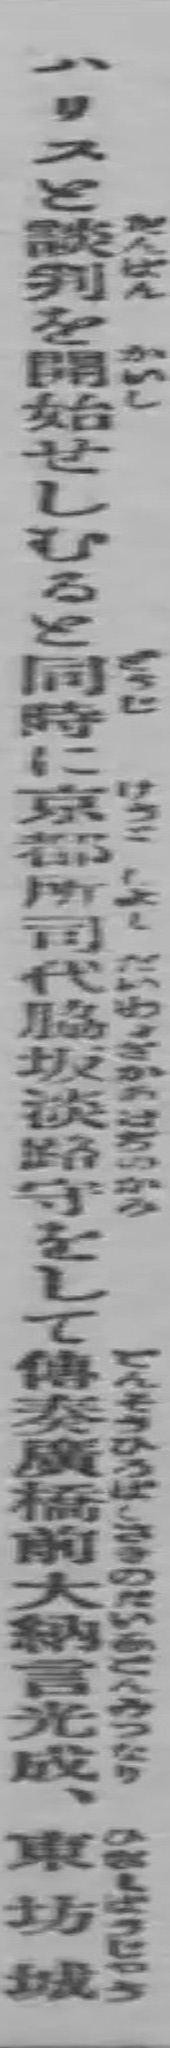ハリスと談判を開始せしむると同時に京都所司代脇坂淡路守をして伝奏広橋前大納言光成、東坊城
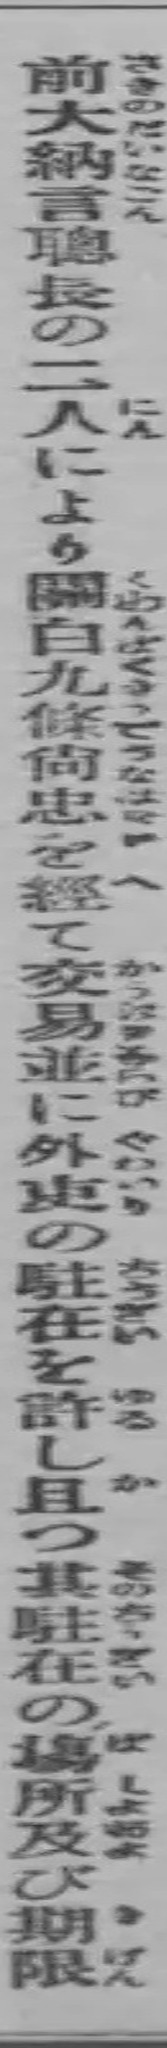前大納言聰長の二人により関白九条尚忠を経て交易並に外吏の駐在を許し且つ其駐在の場所及び期限
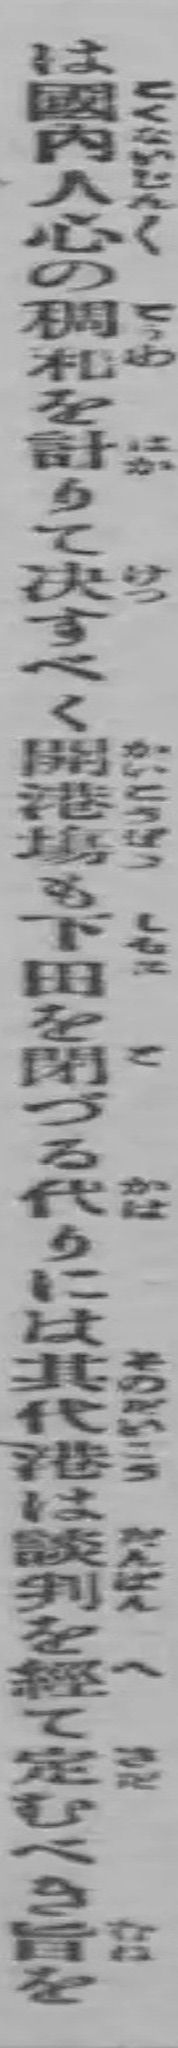は国内人心の稠和を計りて決すべく開港場も下田を閉づる代りには其代港は談判を経て定むべき旨を
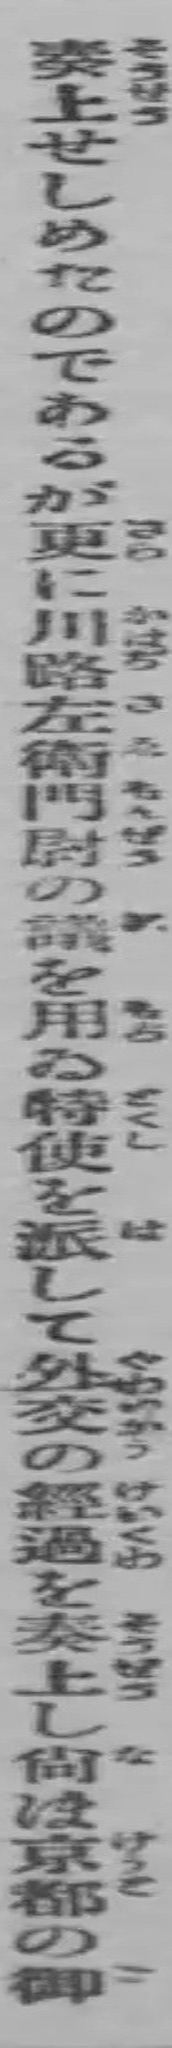奏上せしめたのであるが更に川路左衛門尉の議を用ゐ特使を派して外交の経過を奏上し尚ほ京都の御
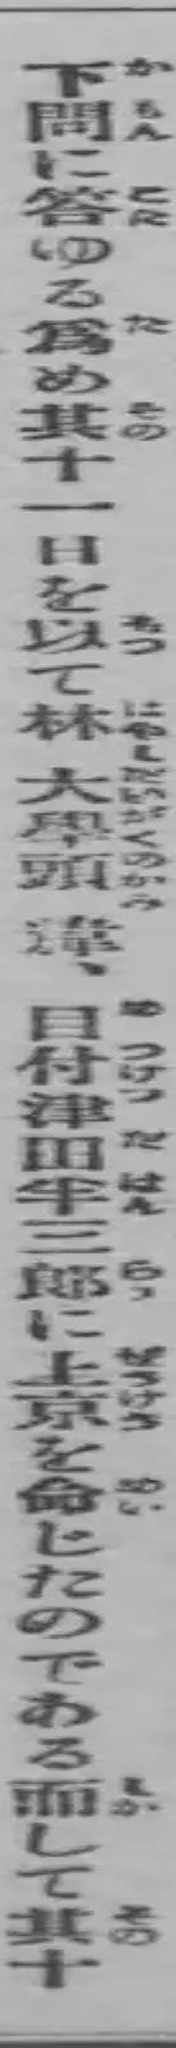下問に答ゆる為め其十一日を以て林大学頭諱、目付津田半三郎に上京を命じたのである而して其十
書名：豊橋市史談
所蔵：国立国会図書館 National Diet Library, JAPAN
